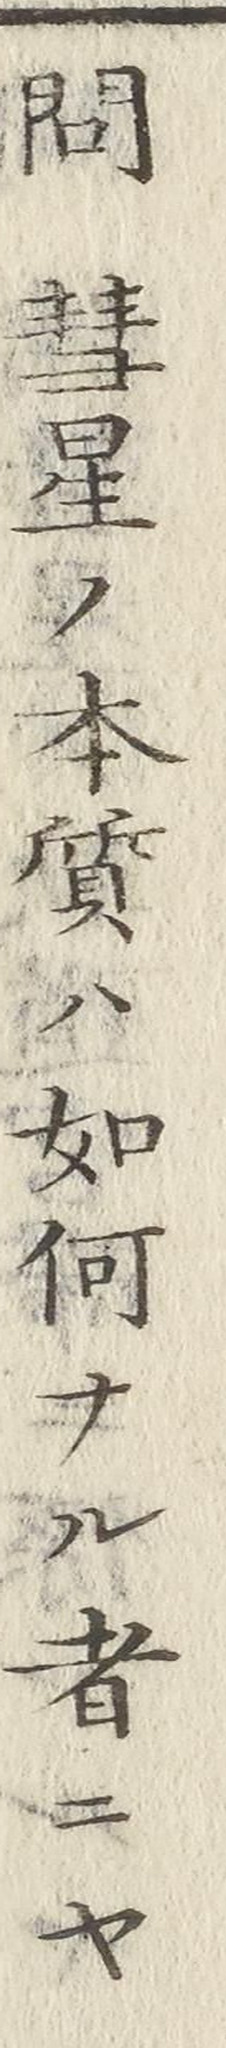問彗星ノ本質トハ如何ナル者ニヤ
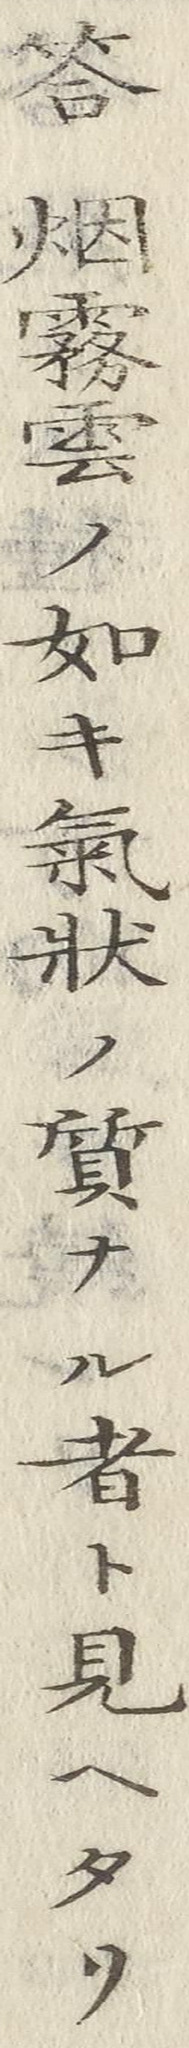答煙霧雲ノ如キ気状ノ質ナル者ト見ヘタリ
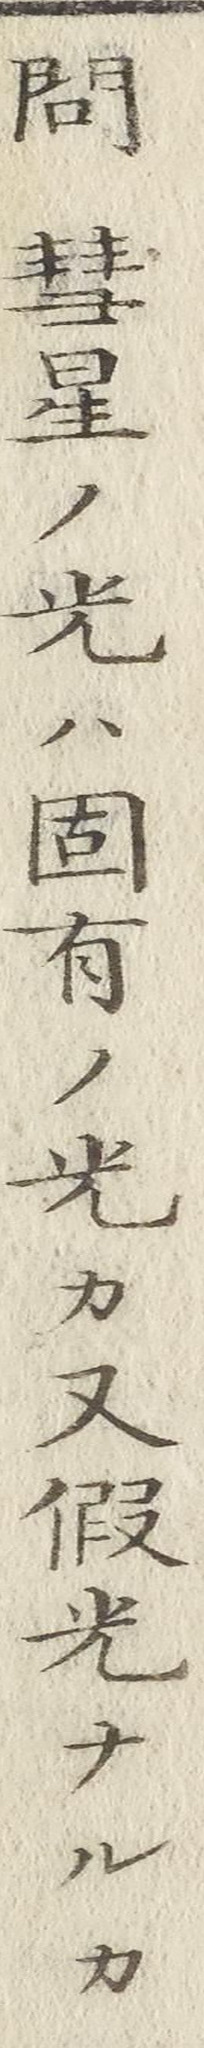問彗星ノ光ハ固有ノ光カ又仮光ナルカ
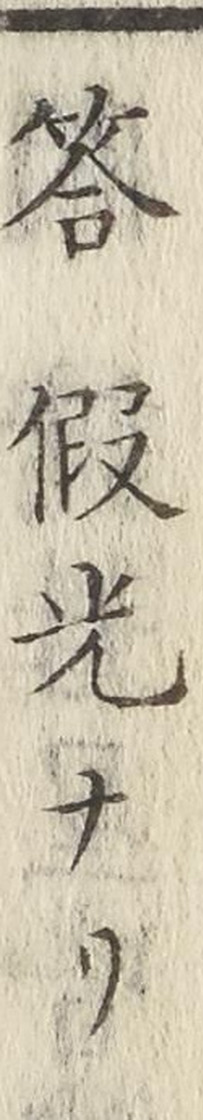答仮光ナリ

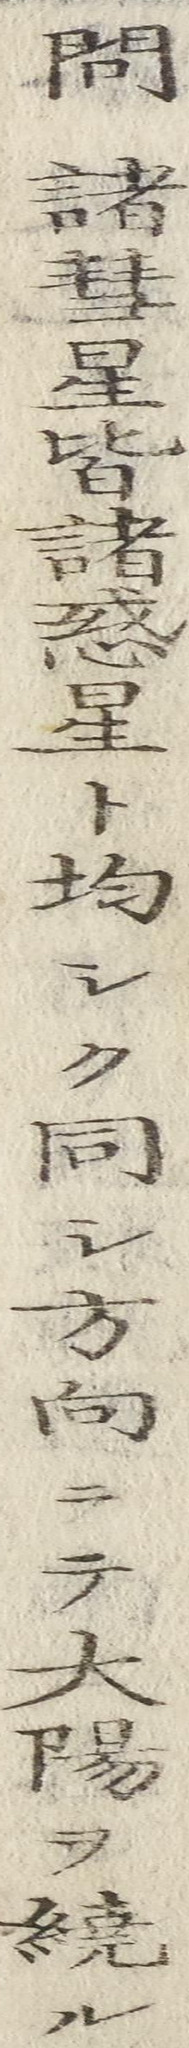問諸彗星皆諸惑星ト均シク同シ方向ニテ大陽ヲ繞ル
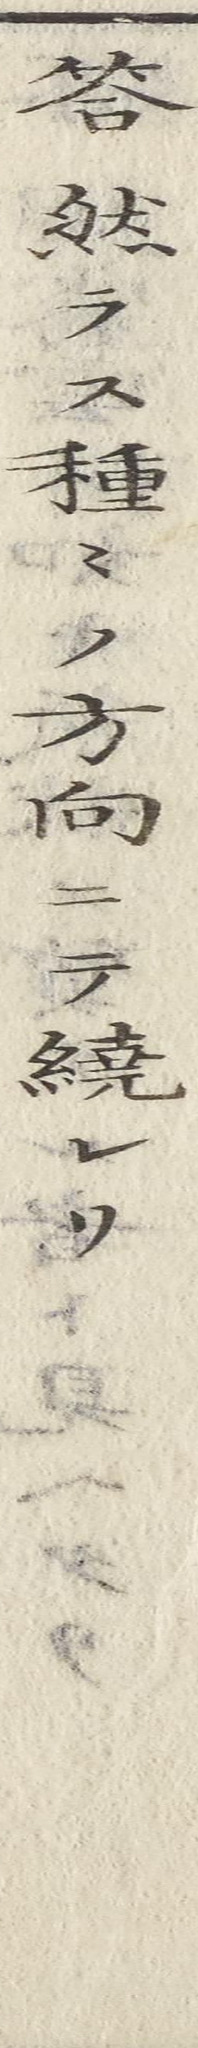答然ラス種々ノ方向ニテ繞レリ
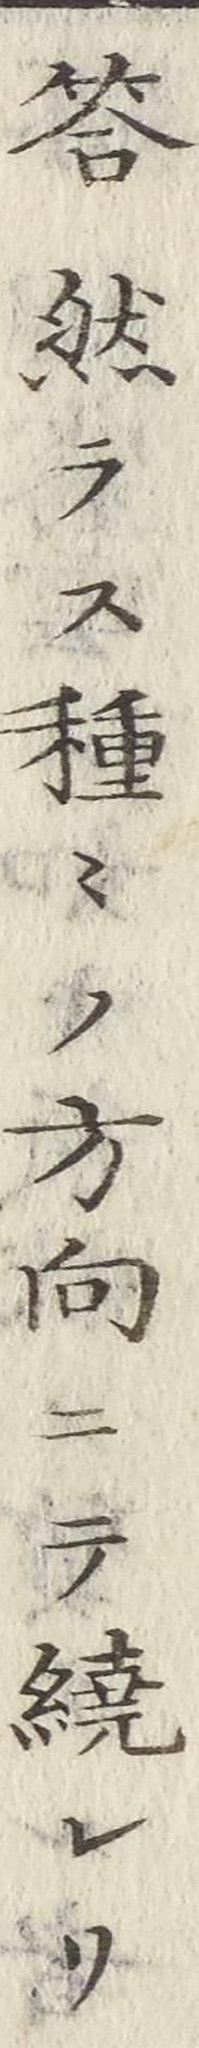答然ラス種々ノ方向ニテ繞レリ
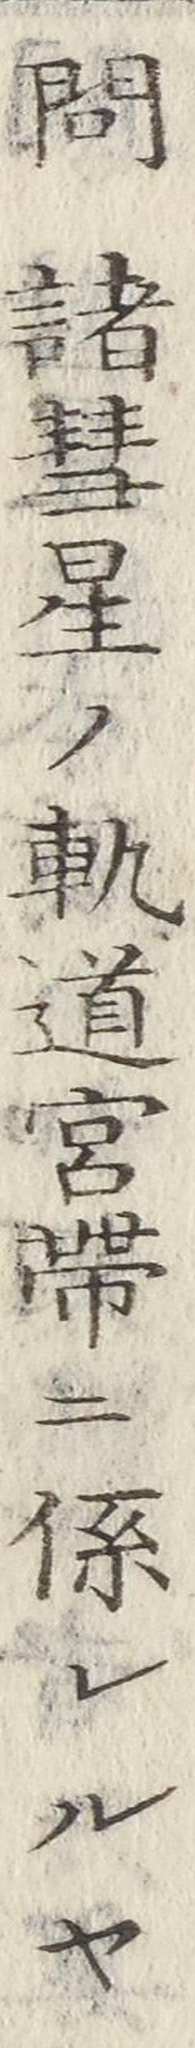問諸彗星ノ軌道宮帯二係レルヤ
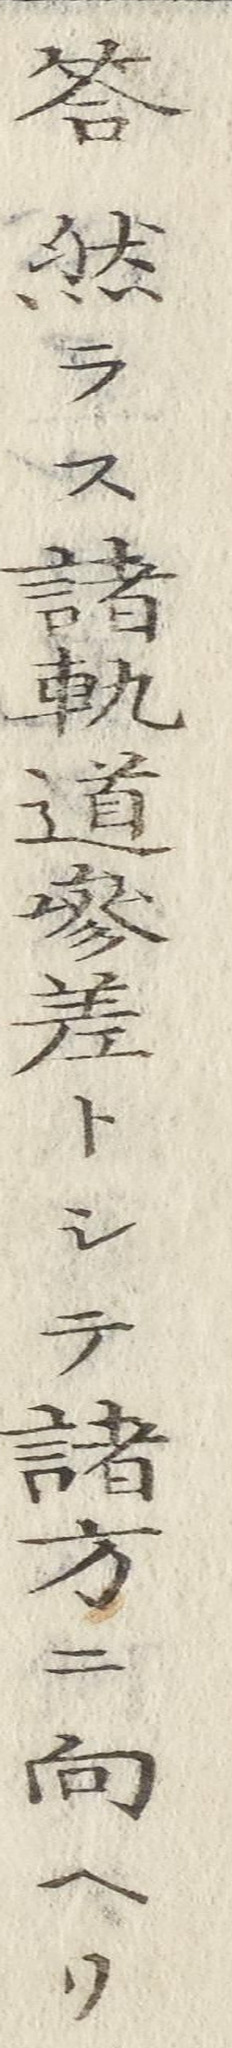答然ラス諸軌道参差トシテ諸方向ニ向ヘリ
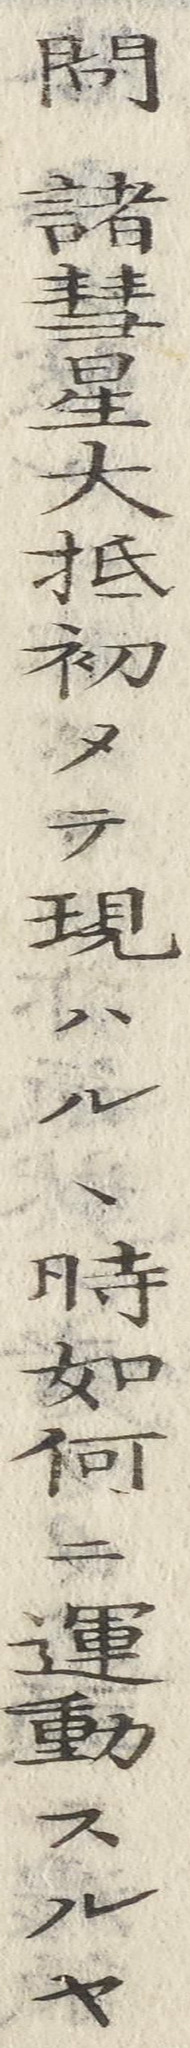問諸彗星大抵初メテ現ハルゝ時如何二運動スルヤ
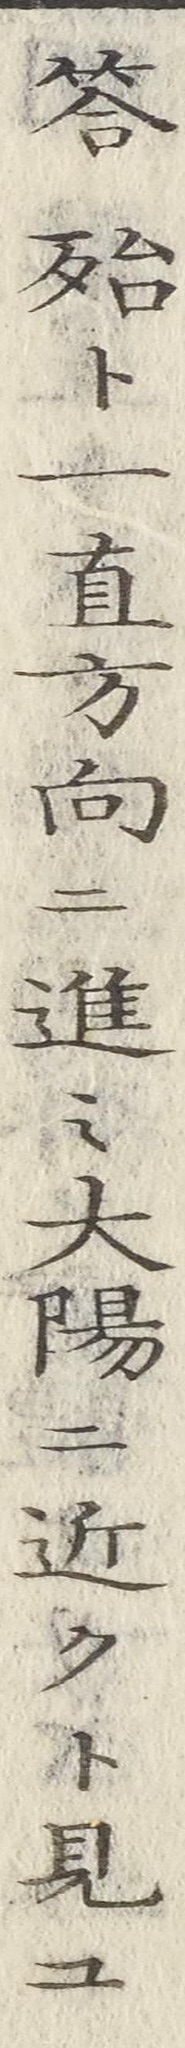答殆ト一直方向ニ進ミ大陽ニ近クト見ュ
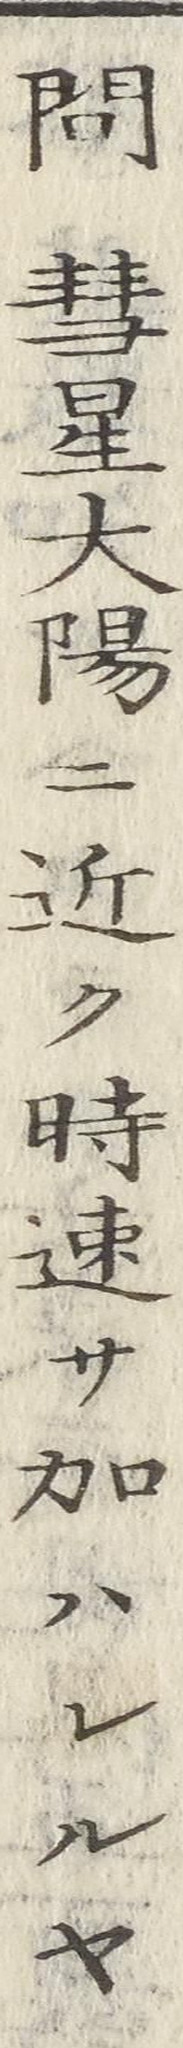問彗星大陽ニ近ク時速サ加ハレルヤ
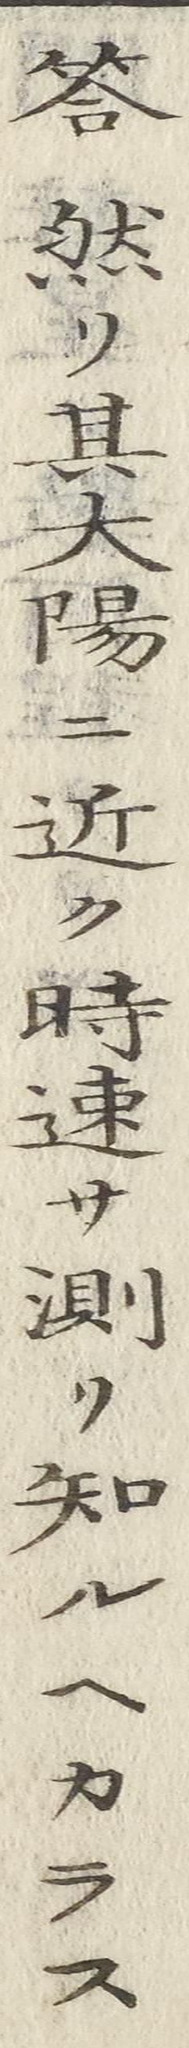答然リ其大陽ニ近ク時速サ測リ知ルへカラス
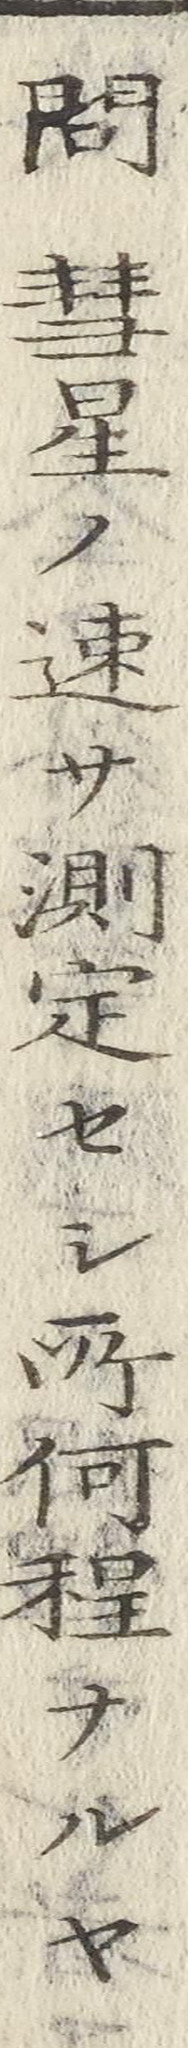問彗星ノ速サ測定セシ所何程ナルヤ
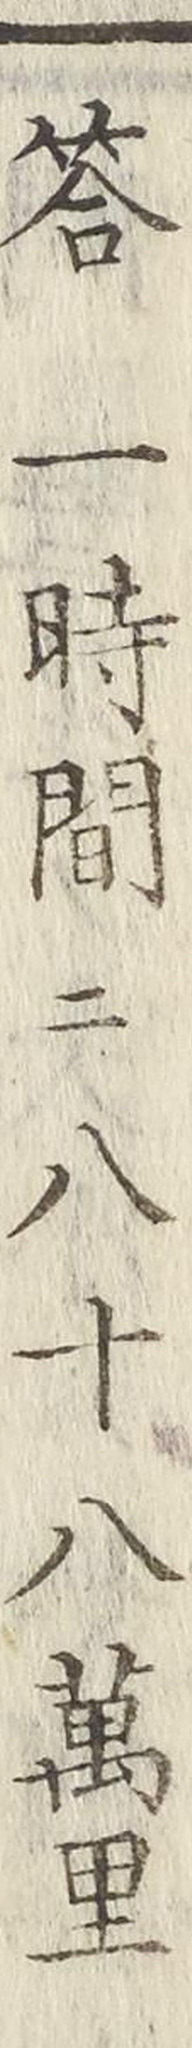答一時間ニ八十八万里
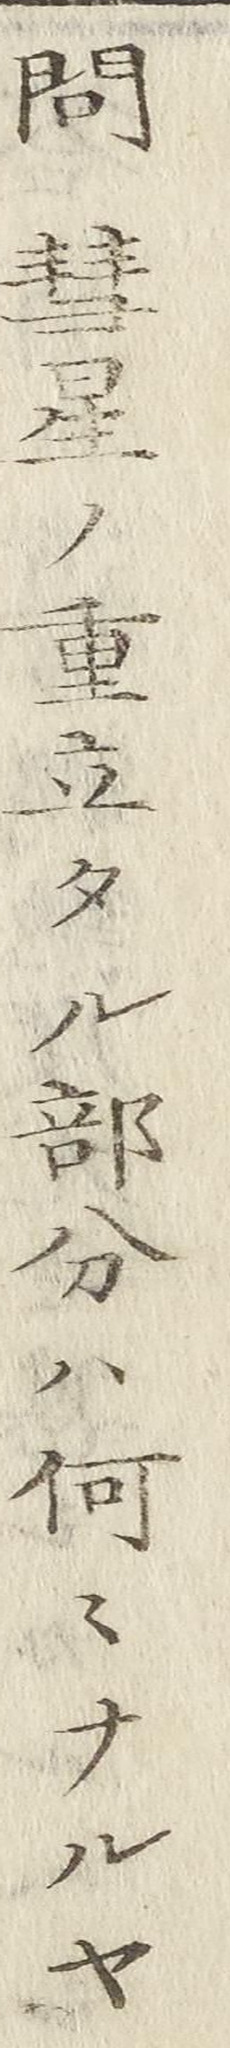問彗星ノ重立タル部分ハ何ゝナルヤ
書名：星学圖説　下
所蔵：東京大学地震研究所図書室 Earthquake Research Institute Library, The University of Tokyo, JAPAN
